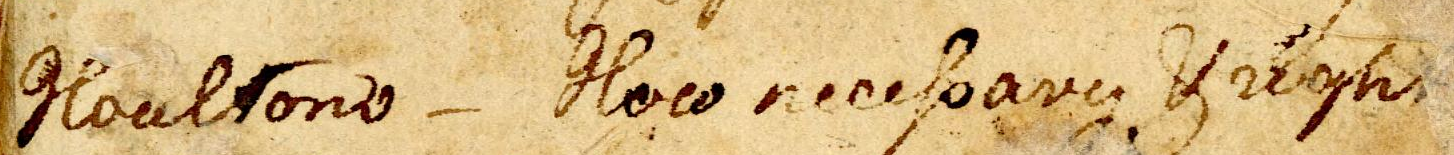Houltons- How necessary &right
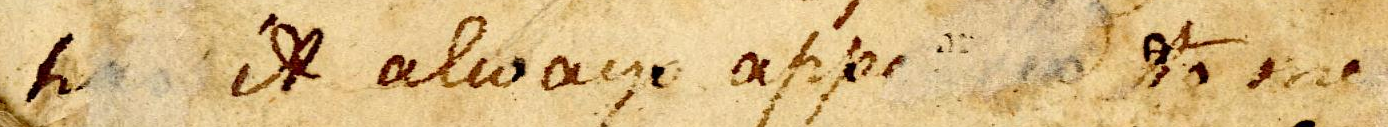has it always appeared to me
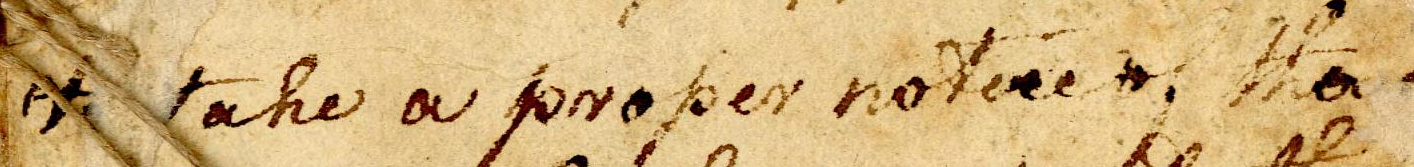[__] take a proper notice of those
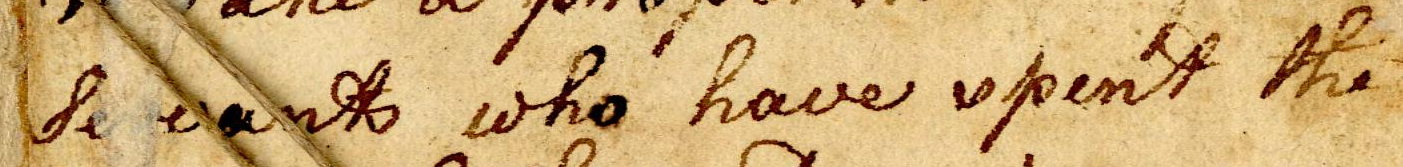Se[rv]ants who have spent the
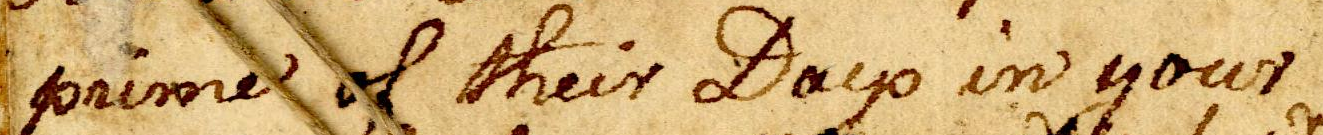prime of their Days in your
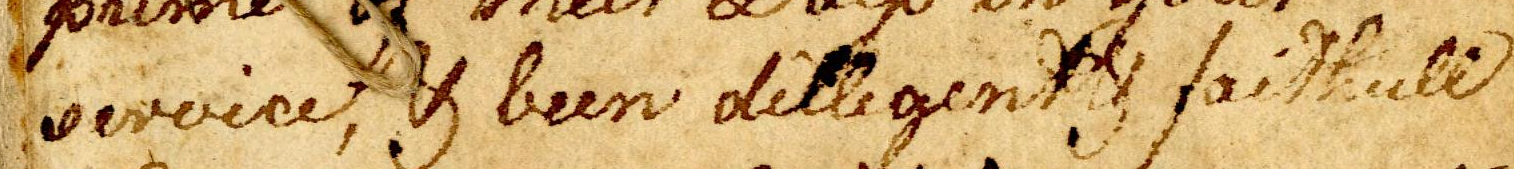service, & been dilligent & faithull
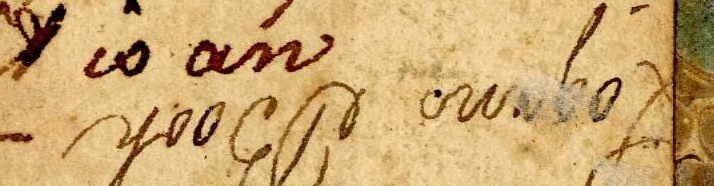Logans Book-
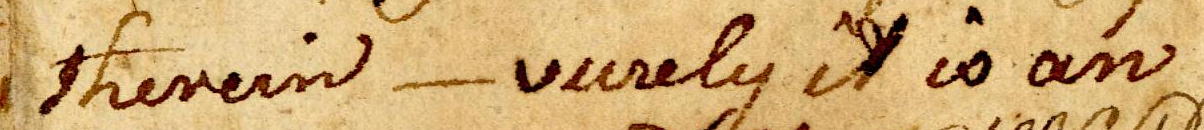therein- surely it is an
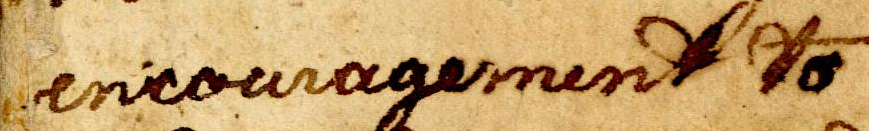encouragement to
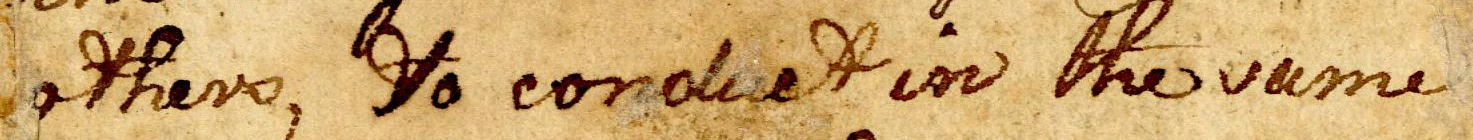others, to conduct in the same
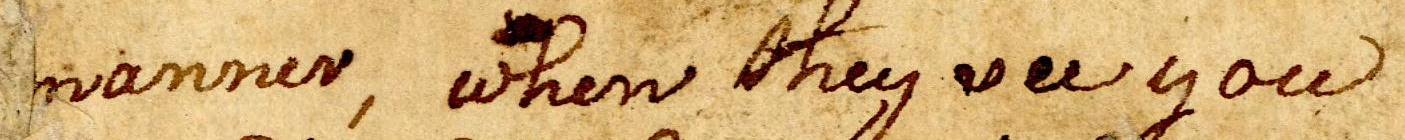manner, when they see you
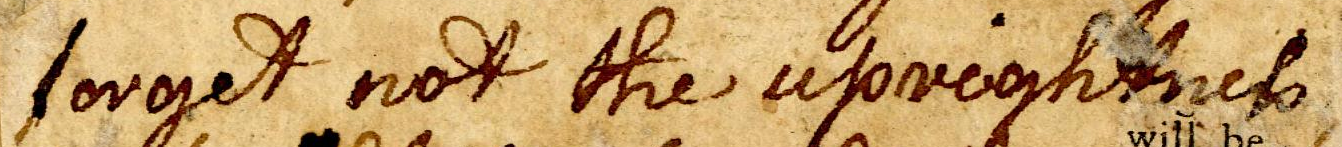forget not the uprightness
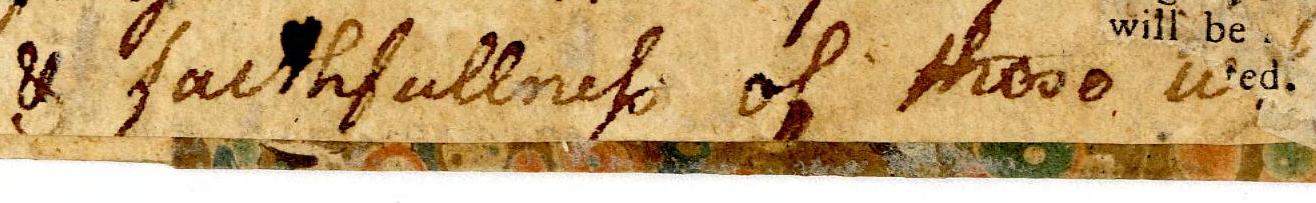& faithfullness of those w
